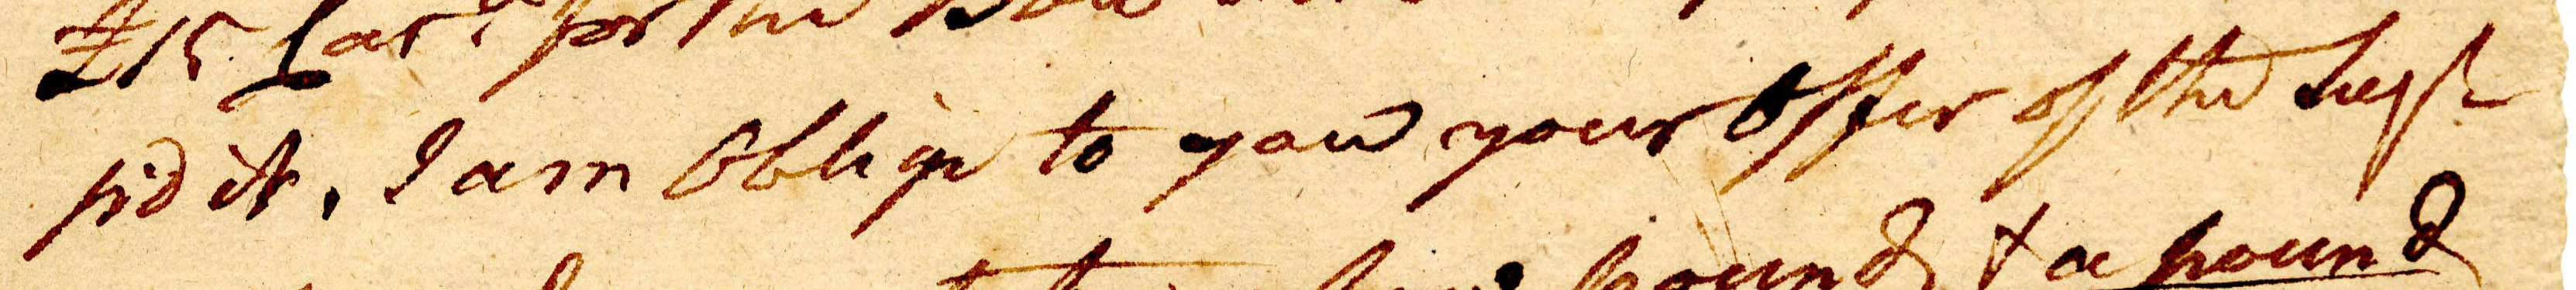p'd it, I am Oblige to you your Offer of the sug^r.
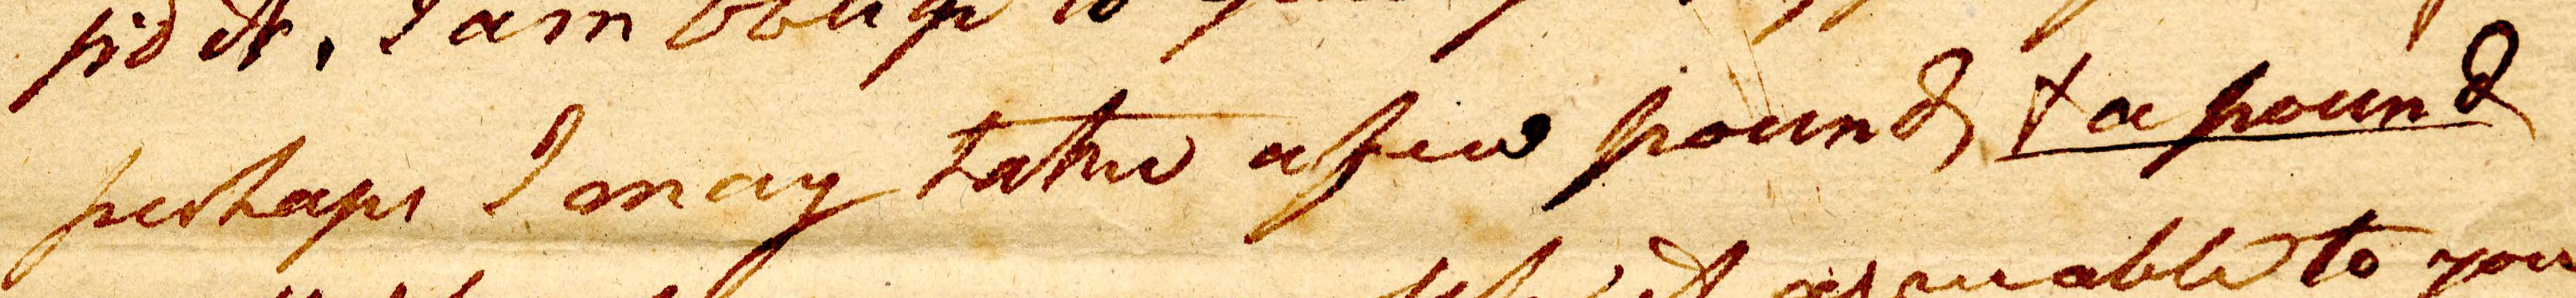perhaps I may take a few pound, & a pound
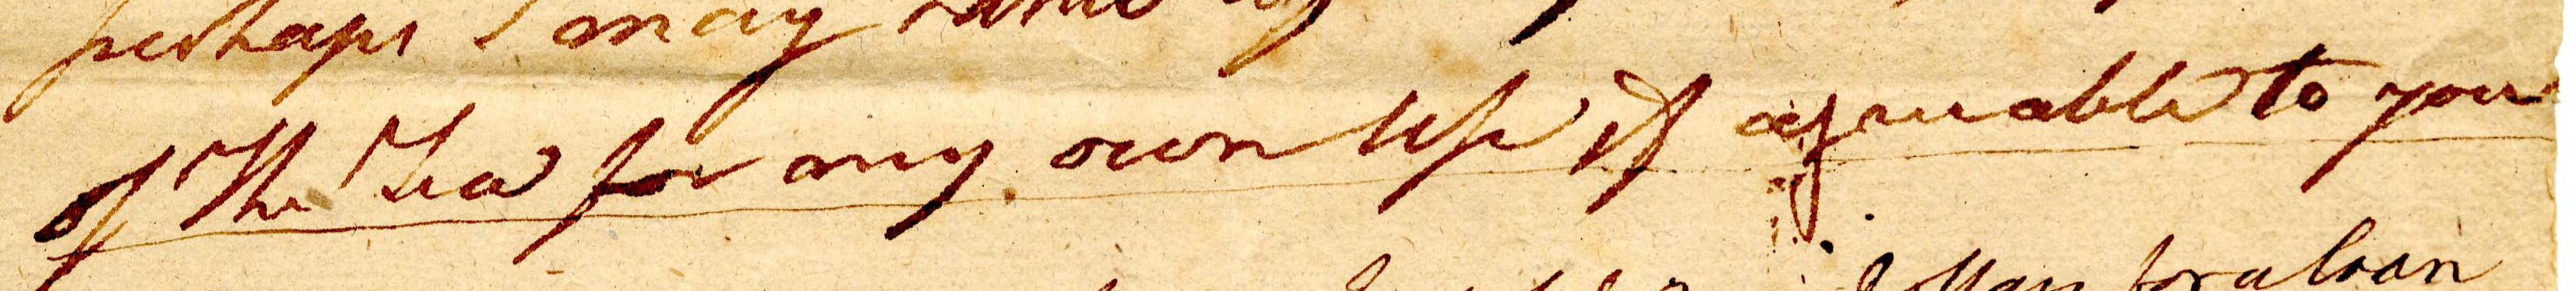of the tea for my own up if agreeable to you
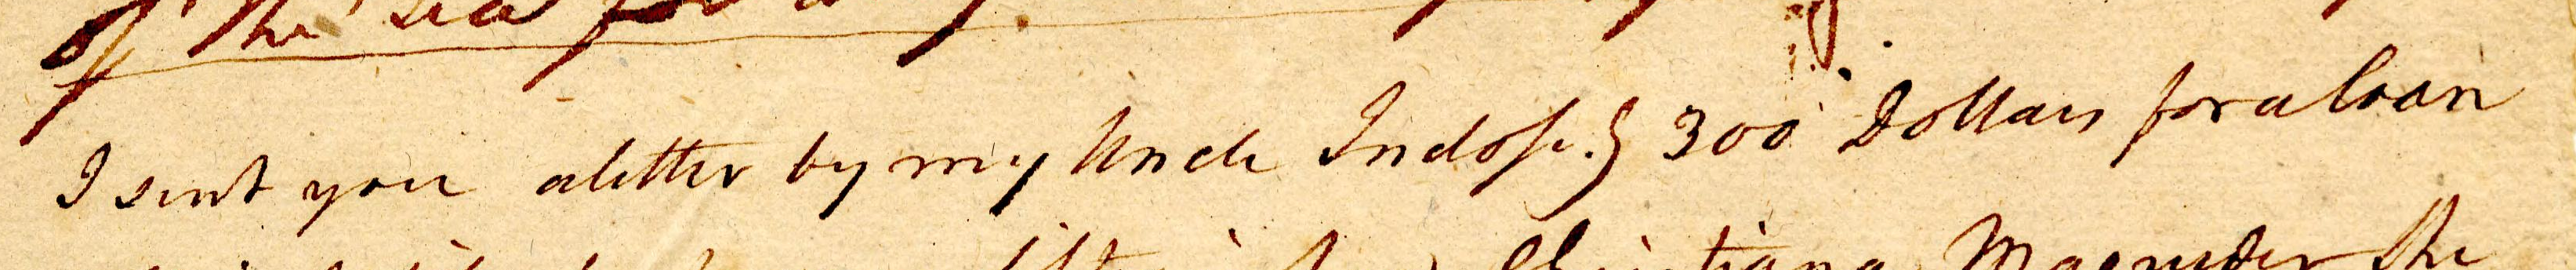I sent you a letter by my Uncle Inclos^g. 300 Dollars for a loan
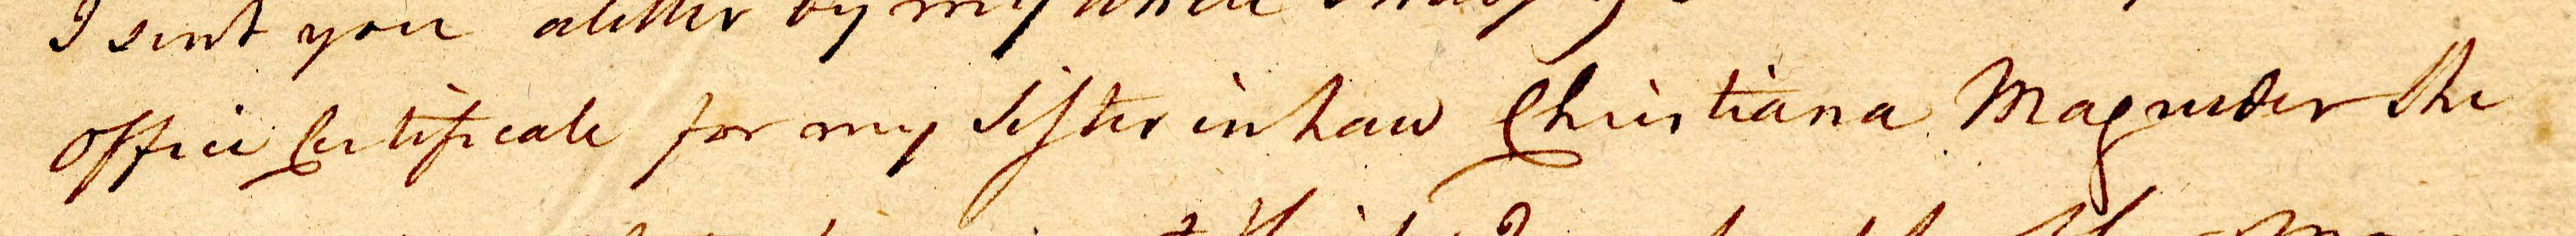office certificate for my Sister in law Christiana Maguider she
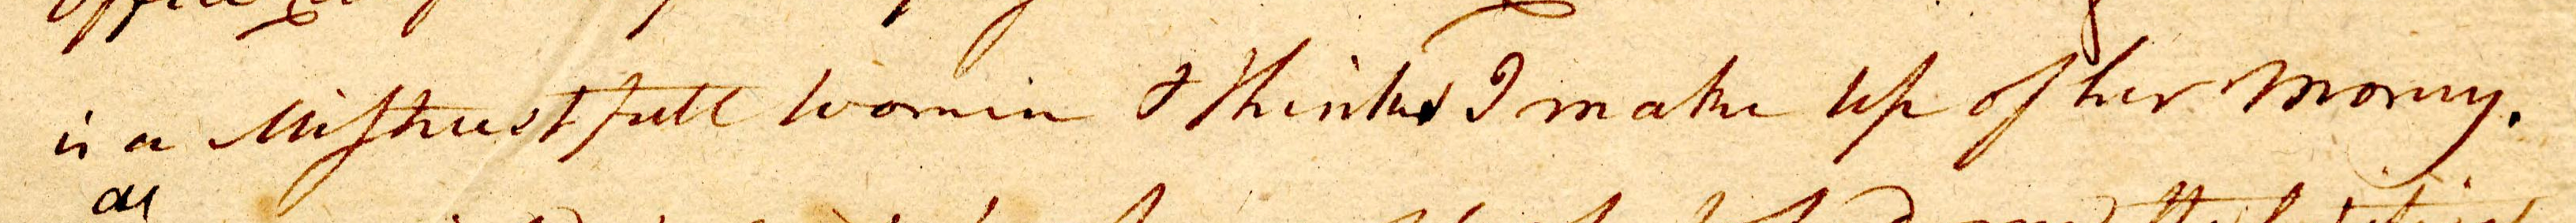is a Mistrustfull womin & thinks I make up of her money.
